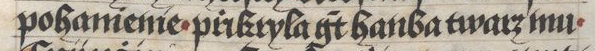pohanienie.pṙikryla ḡt hanba twarz mu.
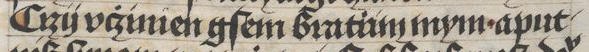Cizij vċzinien gſem bratṙím mym.aput¬
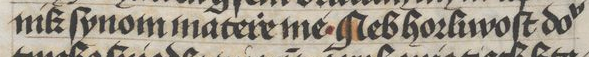nik ſynom mateṙe mé.Neb horliwost dov
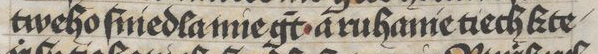twého ſniedla mie ḡt.a ruhanie tiech kte¬
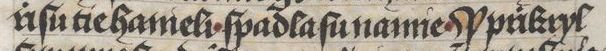ṙiſu tie hanieli.ſpadla ſu nanie.Ypṙikryl
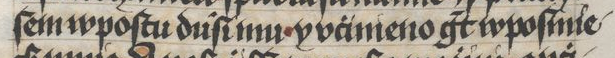ſem wpoſtu duẛi mu.y vċinieno ḡt wpoſmie¬
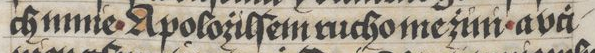ch mnie.A položilſem rucho meżini.a vċi¬
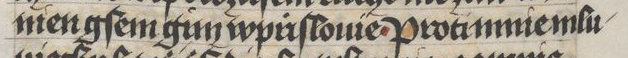nien gſem gim wpṙiſlouie.Proti mnie mlu¬
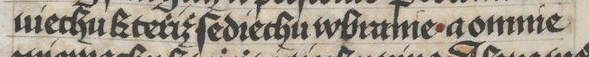uiechu kteṙiż ſediechu wbranie.a omnie
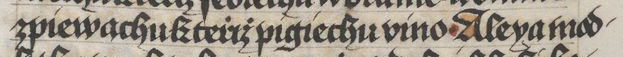zpíewachu kteṙíż pigíechu víno.Aleya mod¬
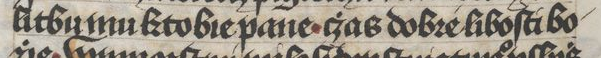litbu mu ktobie pane.cżas dobré liboſti bo¬
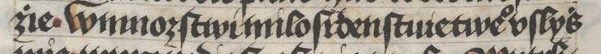żie.Wmnozſtwí miloſrdenſtuie tweo vſlyṡ
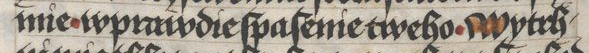mie.wprawdie ſpaſenie tweho.Wytrh¬
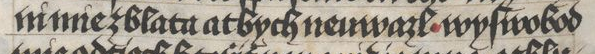ni mie zblata atbych neuwazl.wyſwobod
